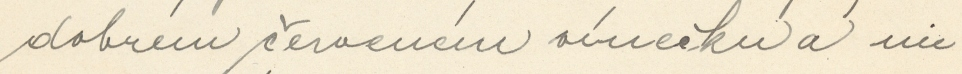dobrém červeném vínečku a nic
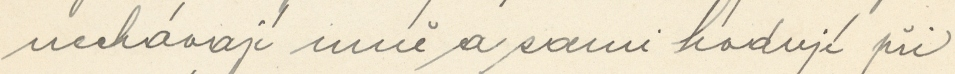nechávají mně a sami hodují při
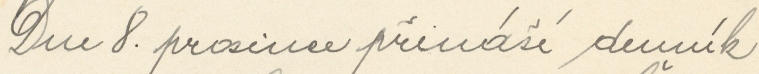Dne 8. prosince přináší denník
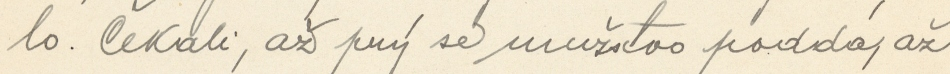lo. Čekali, až prý se mužstvo poddá, až
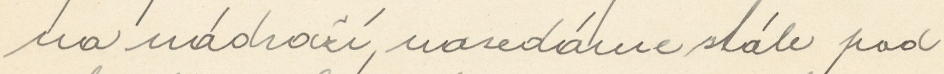na nádraží, nasedáme stále pod
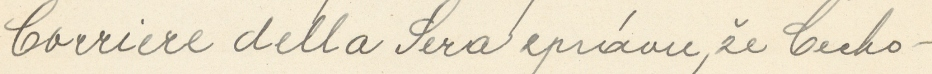Corriere della Sera zprávu, že Čecho-
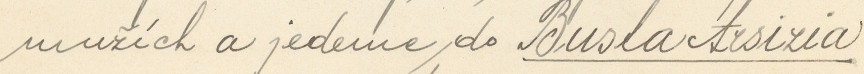mužích a jedeme do Busta Arsizia
